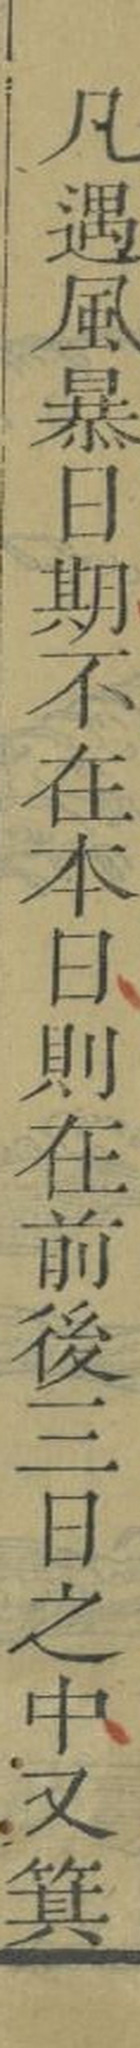凡遇風暴日期不在本日則在前後三日之中又箕
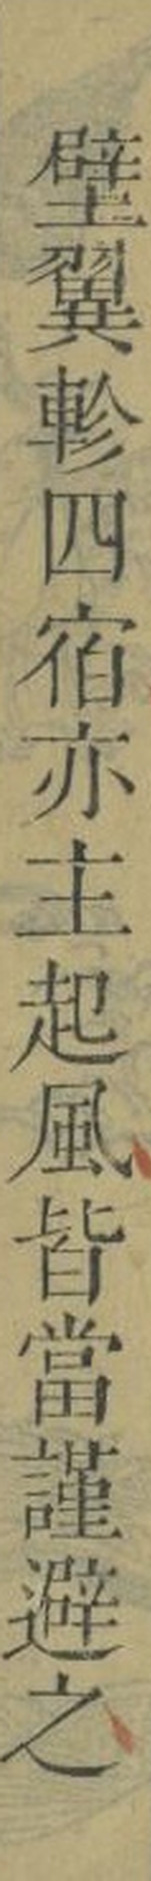壁翼軫四宿亦主起風皆當謹避之
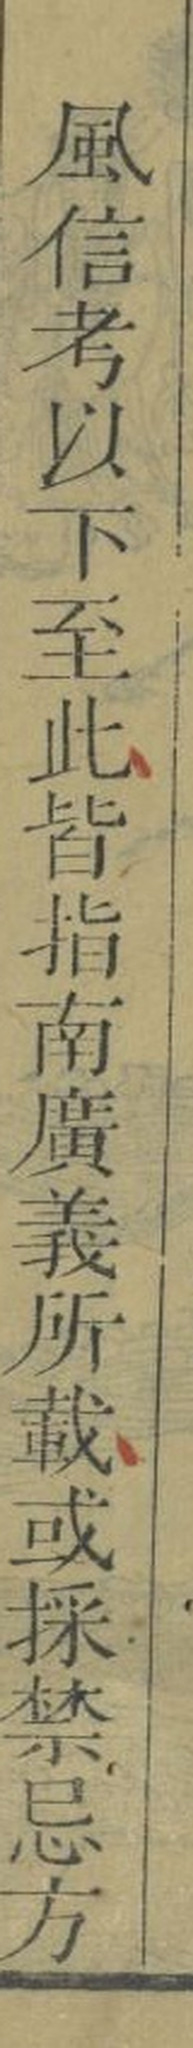風信考以下至此皆指南廣義所載或採禁忌方
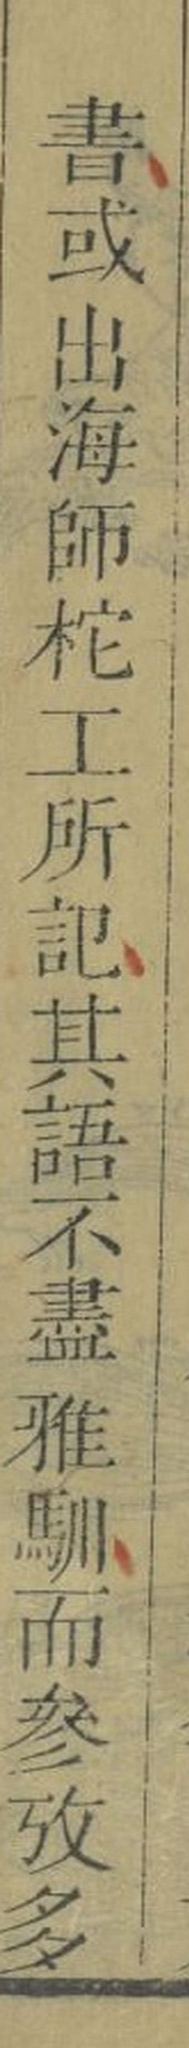書或出海師柁工所記其語不盡雅馴而參攷多
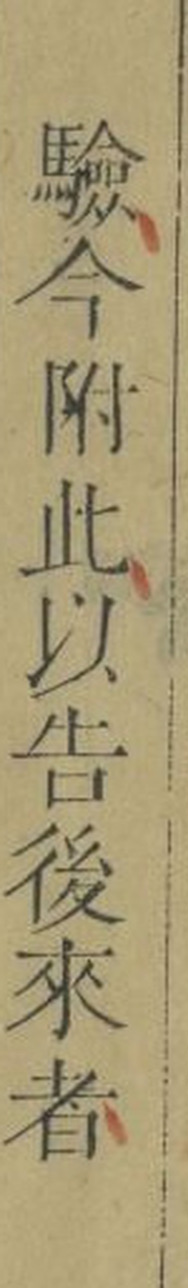驗今附此以告後來者

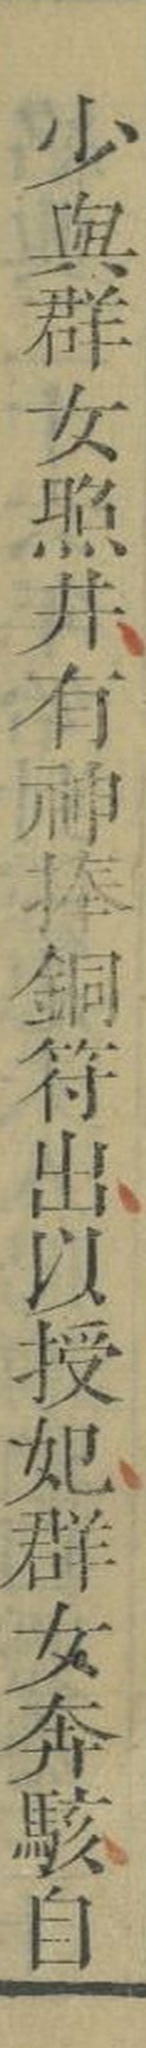少與群女照井有神捧銅符出以授妃群女奔駭自
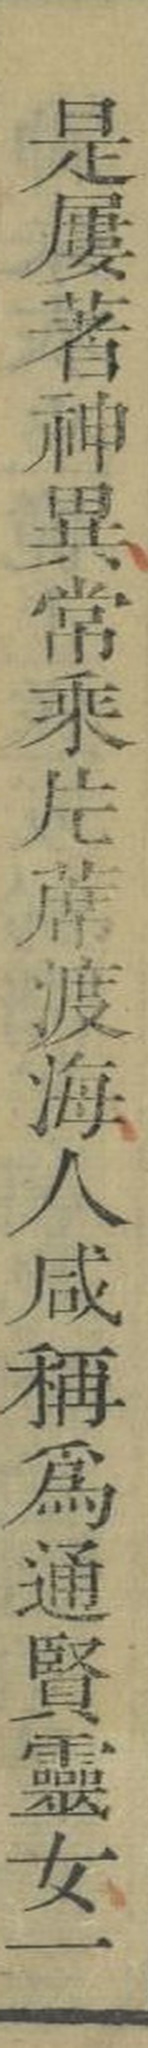是屢著神異常乘片蓆渡海人咸稱爲通賢靈女一
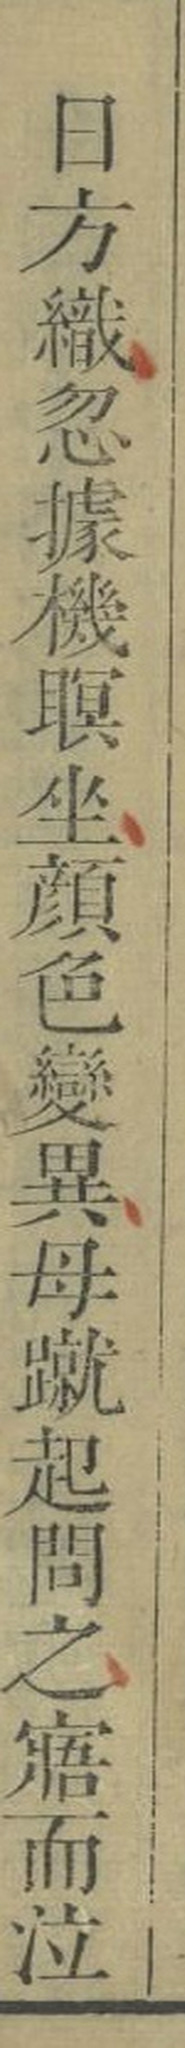日方織忽據機瞑坐顔色變異母蹴起問之寤而泣
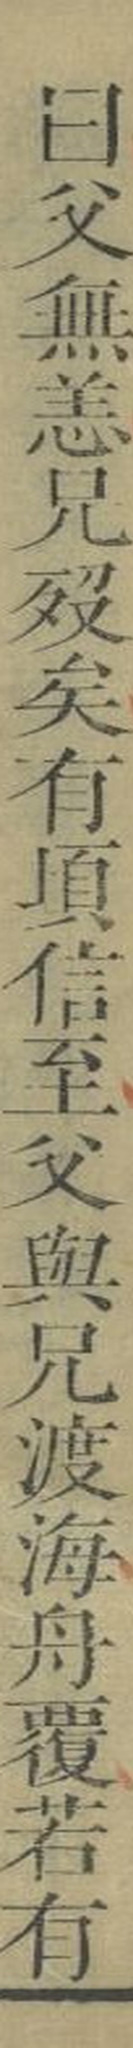曰父無恙兄歿矣有頃信至父與兄渡海舟覆若有
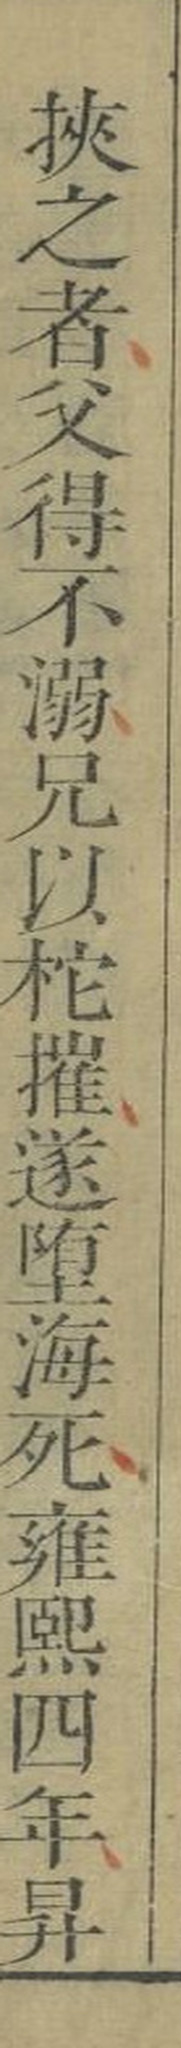挾之者父得不溺兄以柁摧遂堕海死雍熙四年昇

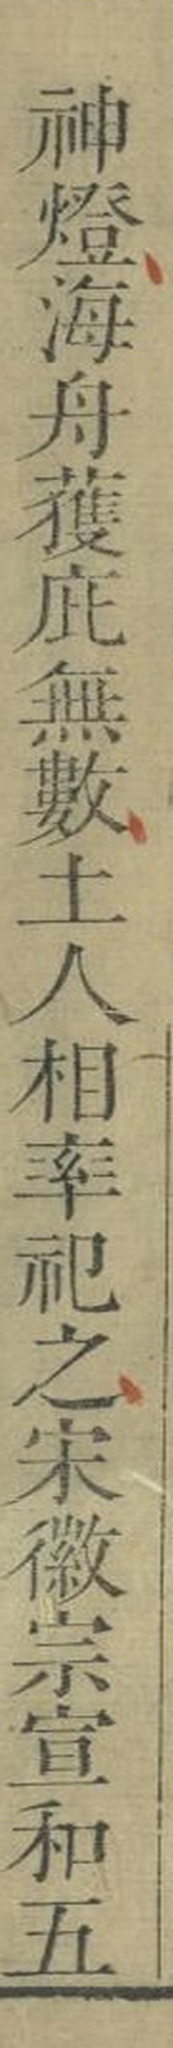神燈海舟獲庇無數土人相率祀之宋徽宗宣和五
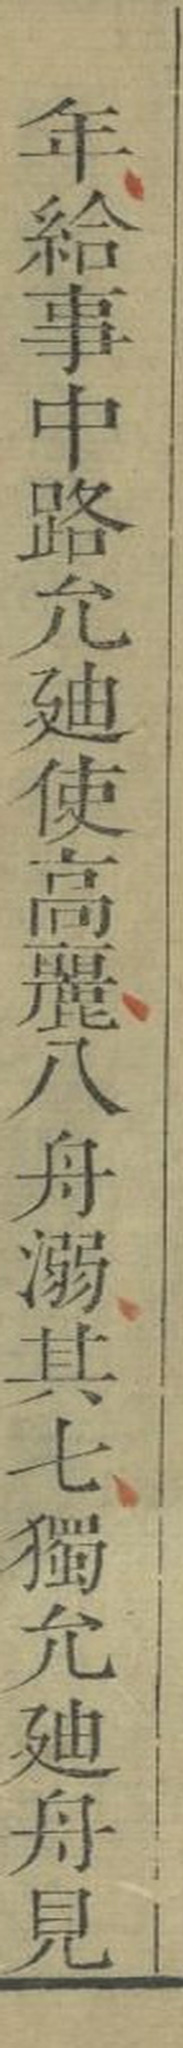年給事中路允廸使高麗八舟溺其七獨允廸舟見
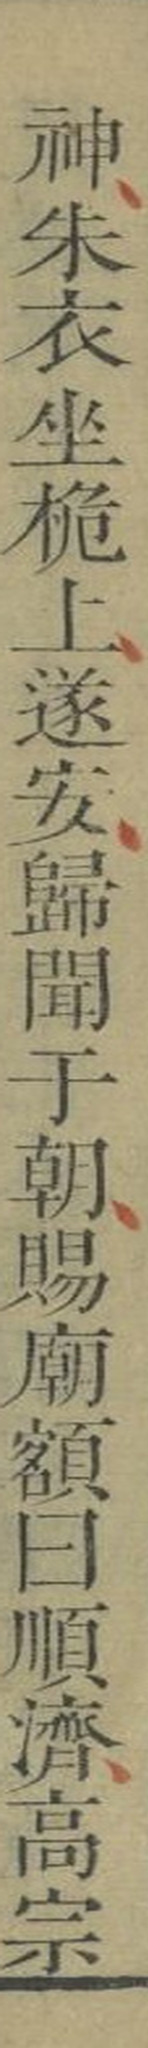神朱衣坐桅上遂安歸聞于朝賜廟額曰順濟高宗
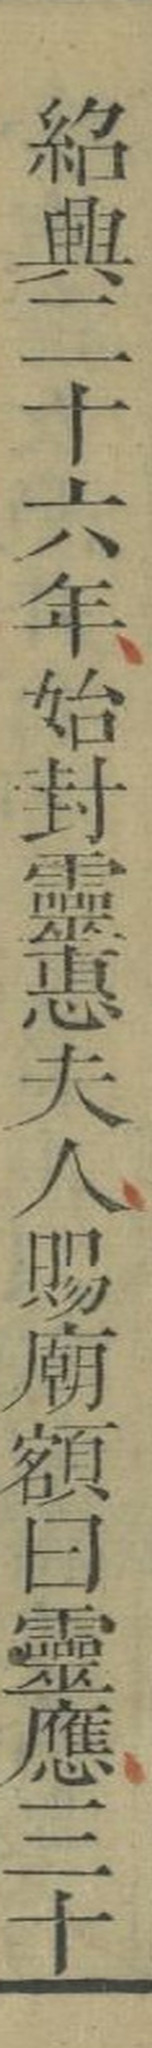紹興二十六年始封靈惠夫人賜廟額曰靈應三十
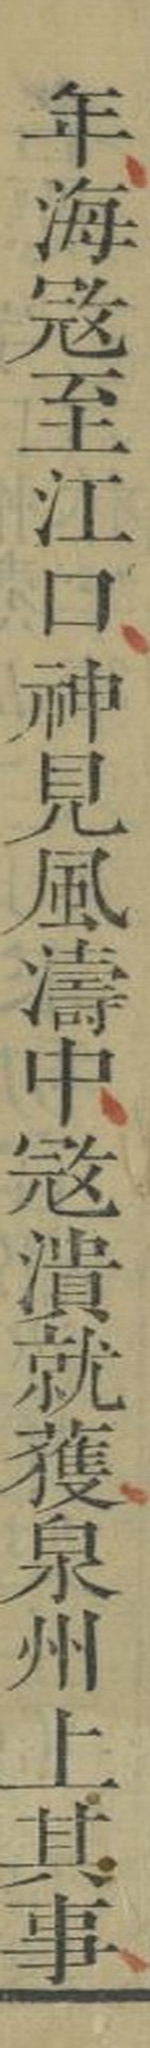年海冦至江口神見風濤中冦潰就獲泉州上其事
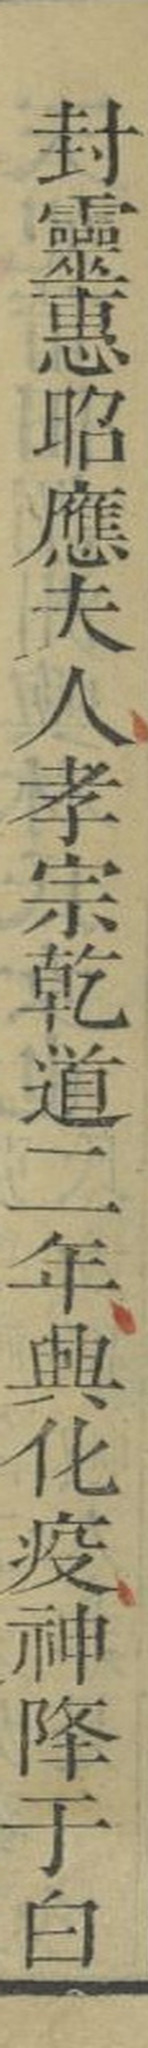封靈惠昭應夫人孝宗乾道二年興化疫神降于白
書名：中山伝信録 巻一、巻二
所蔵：University of the Ryukyus Library
